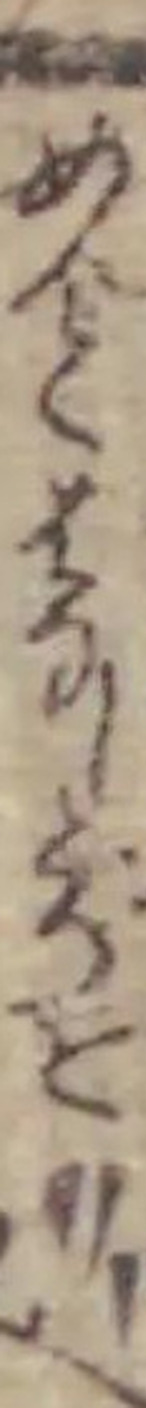めんとはなしとりを
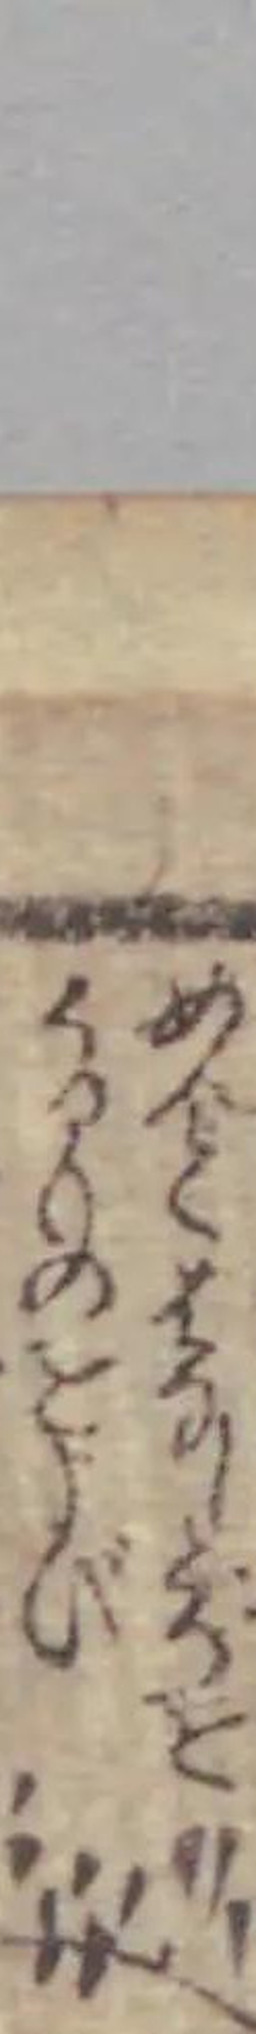うるものをよび
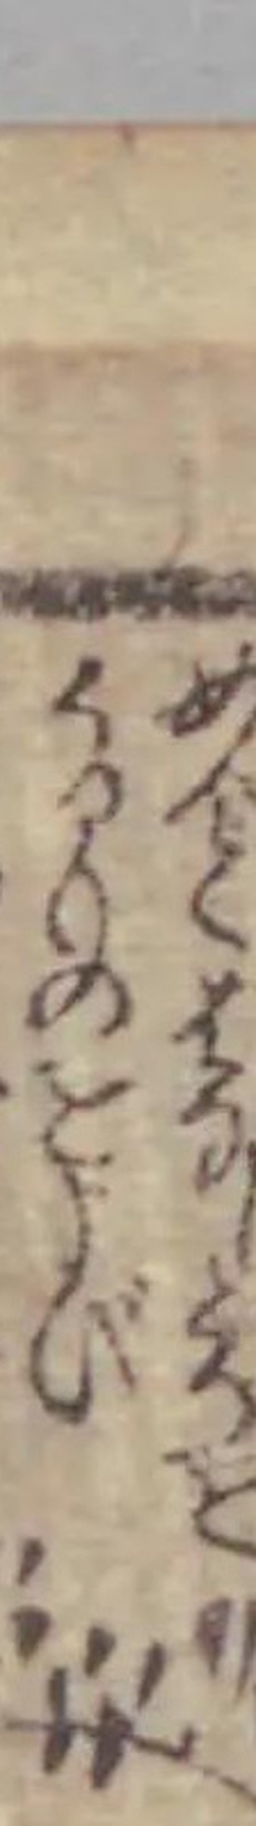うるものをよび
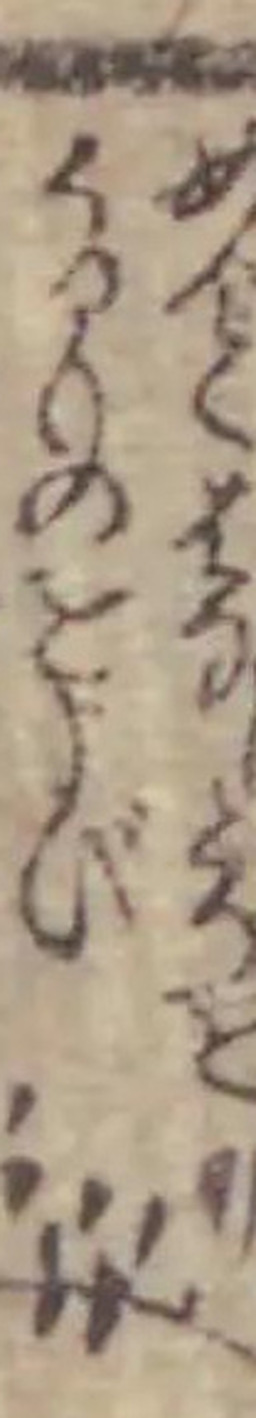うるものをよび
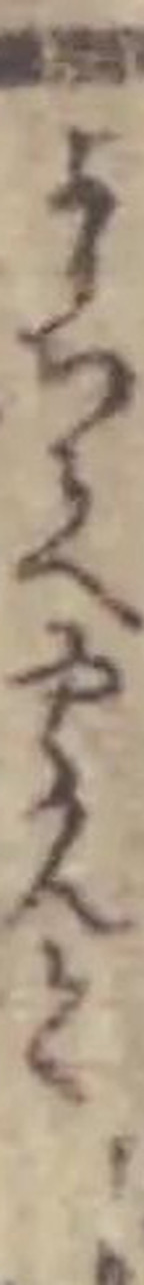よしはらへやらんと
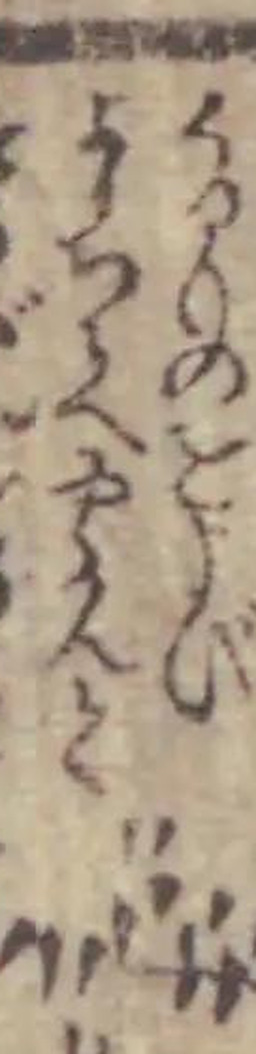よしはらへやらんと
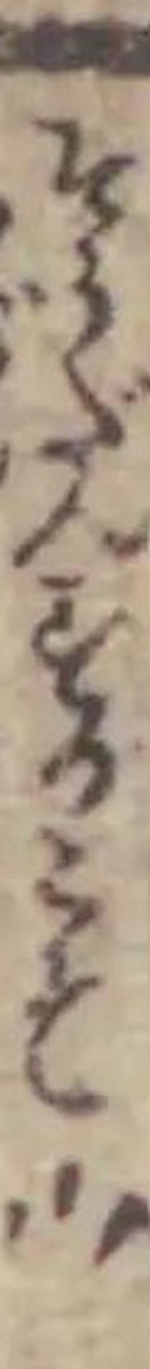そうだんすること
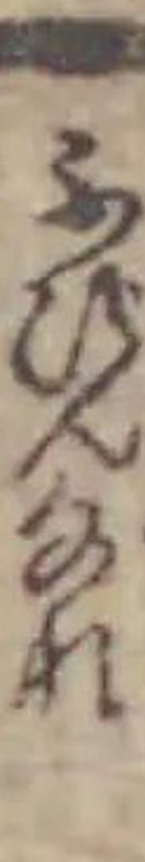ふびんなれ
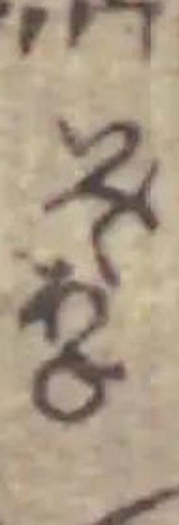いへ〳〵あね
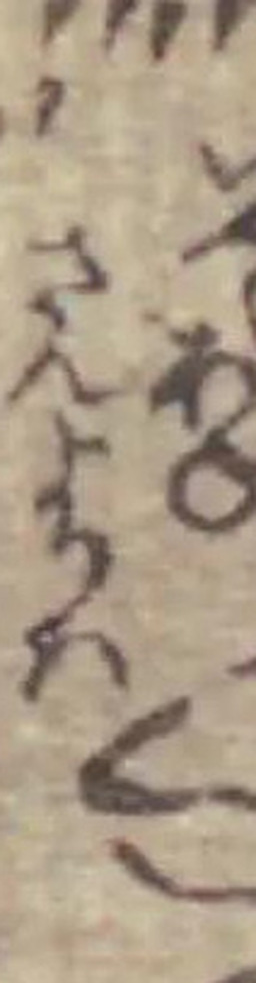さんよりは
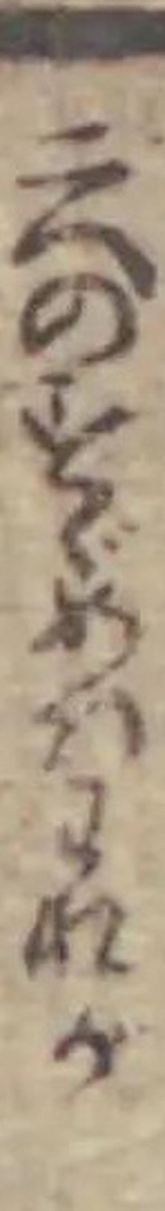二人のすゞめはわれが
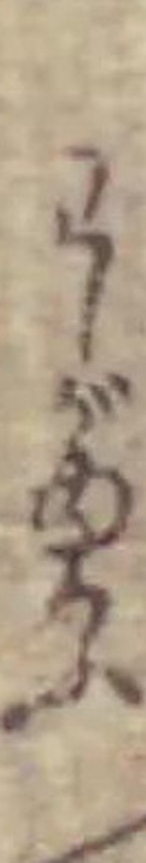わしがゆかふ
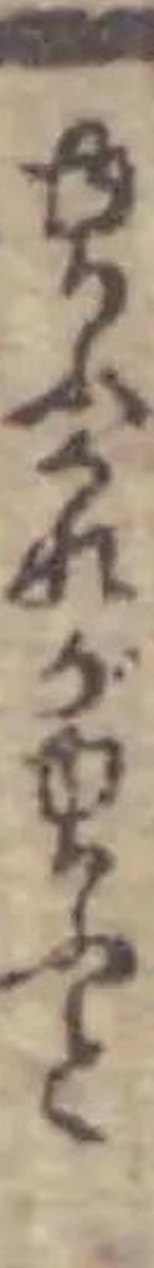ゆかふかれがゆかふと
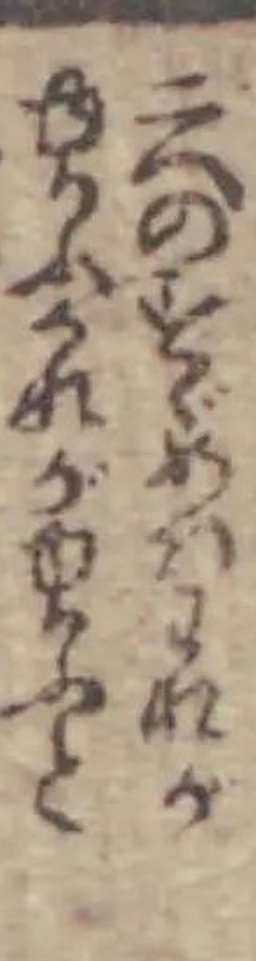ゆかふかれがゆかふと
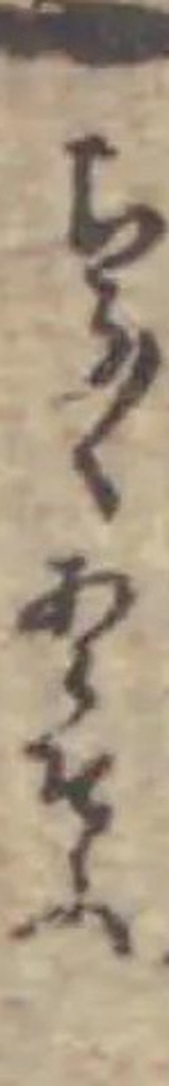ちら〳〵あらそふ
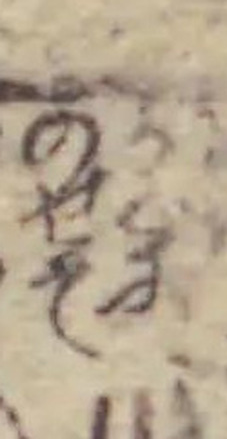のせて
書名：冷水灰毛猫 2巻
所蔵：国立国会図書館 National Diet Library, JAPAN
